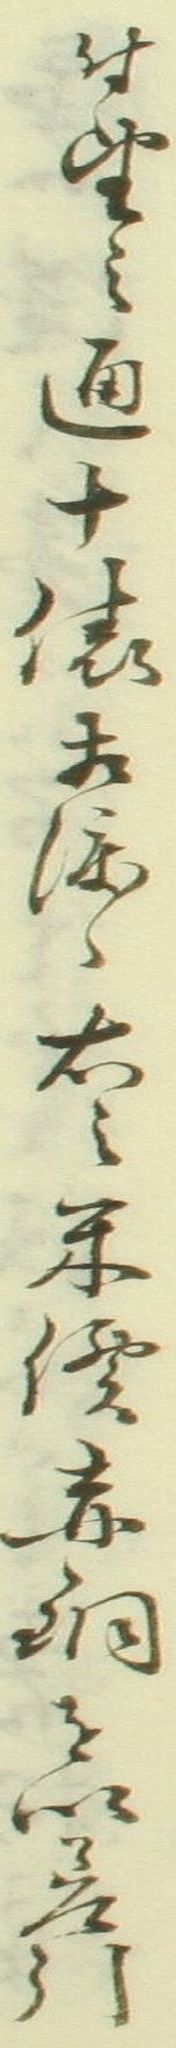付望之通十俵相渡候右之米価赤銅を以差引
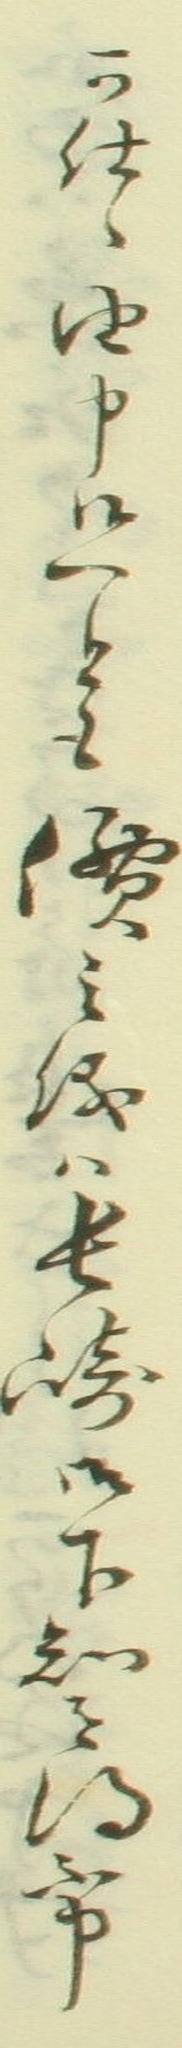可仕候由申候へとも価之儀は長崎御下知を得不申

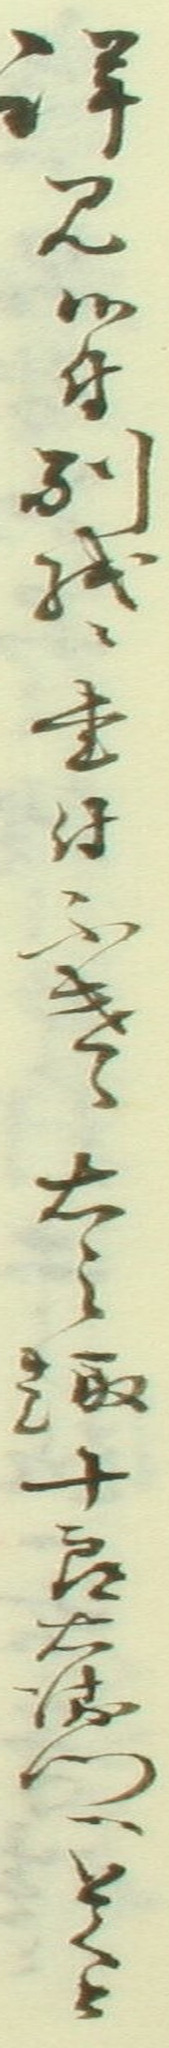祥見候付別紙に書付不遣候右之趣十郎右衛門へとくと
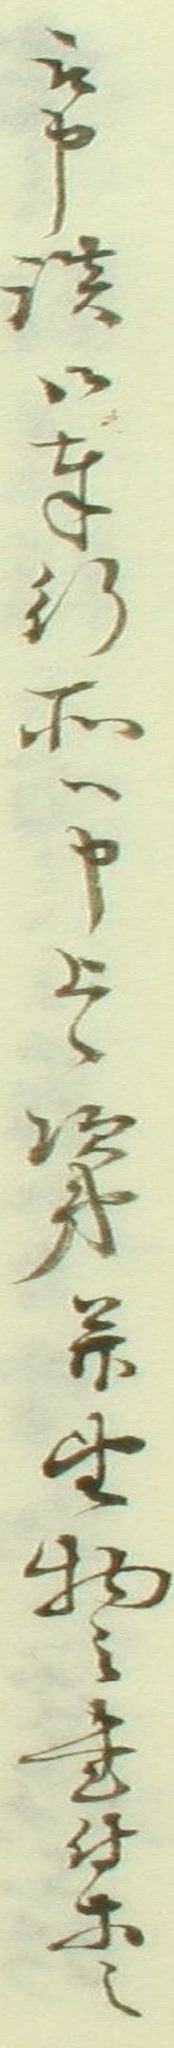被申談御奉行所へ申上候次第并望物之書付等之
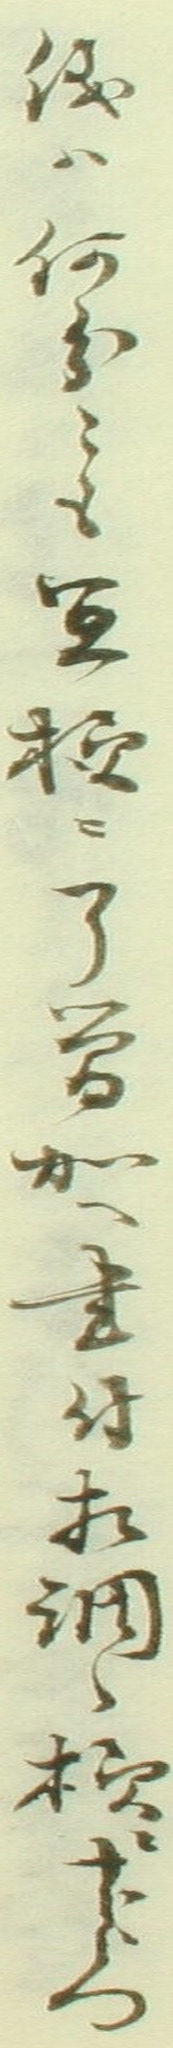儀は何分にも宜様に了簡加へ書付相調候様に十郎右衛門
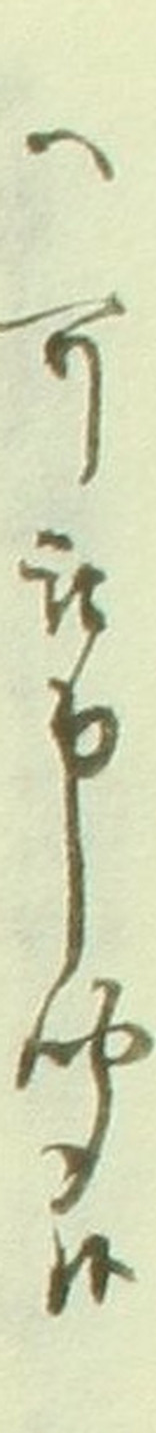へ可被申聞候
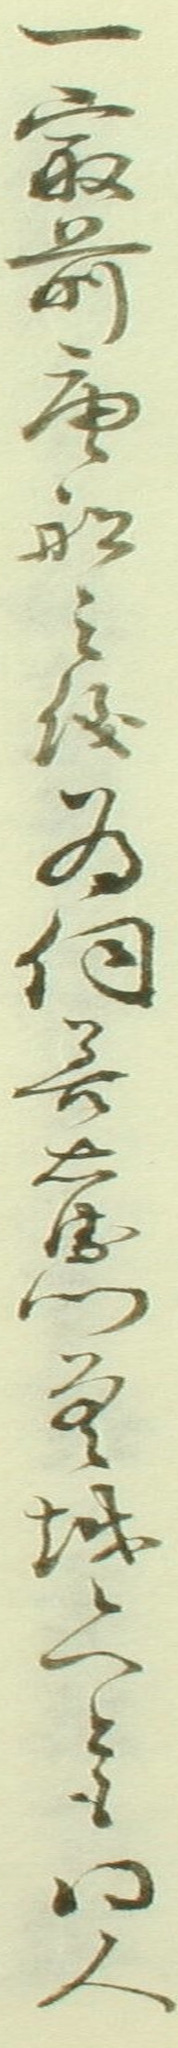一最前唐船之儀為伺善右衛門差越候へとも同人
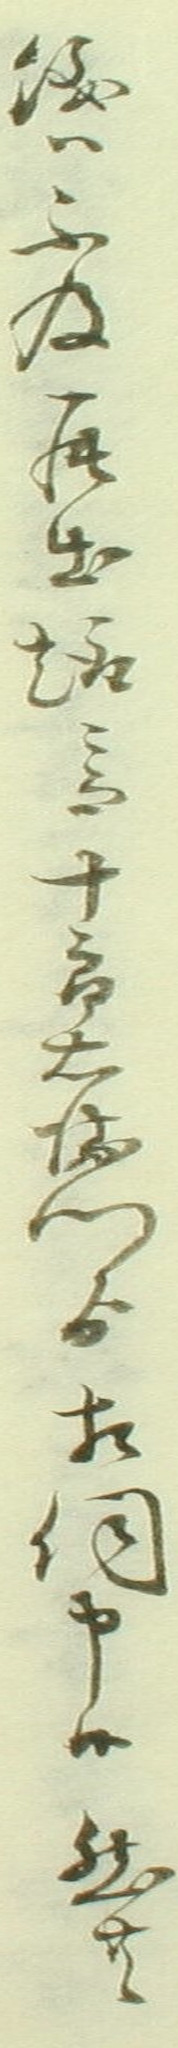儀は不及罷出趣に而十郎右衛門ゟ相伺申候然共
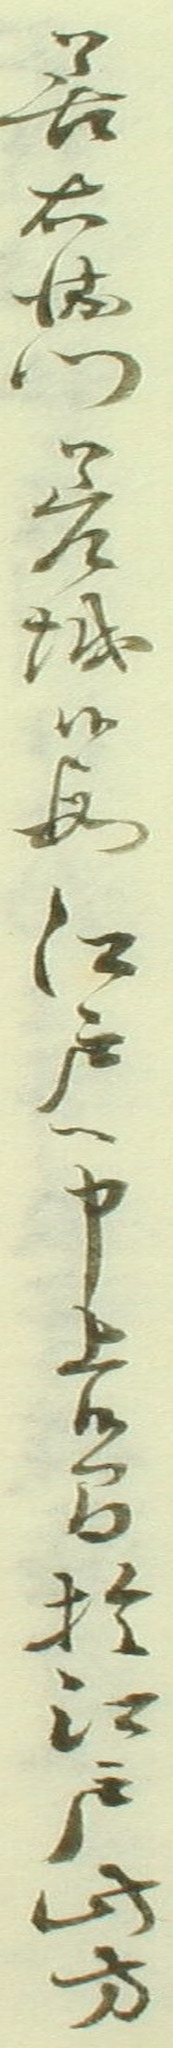善右衛門差越候段江戸へ申上候間於江戸此方
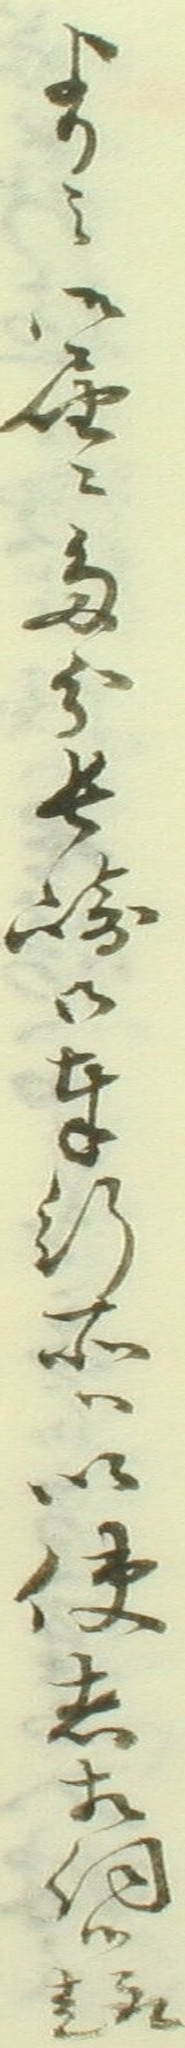より之御届に多分長崎御奉行所へ御使者相伺候趣
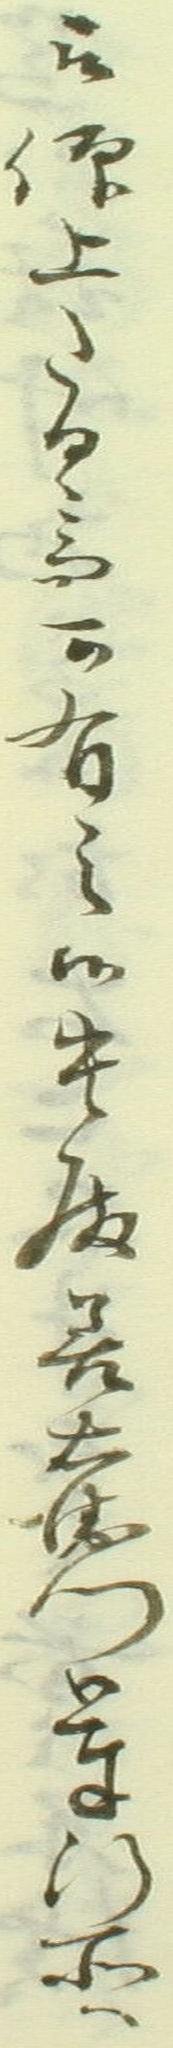被仰上たるに而可有之候貴殿善右衛門御奉行所へ
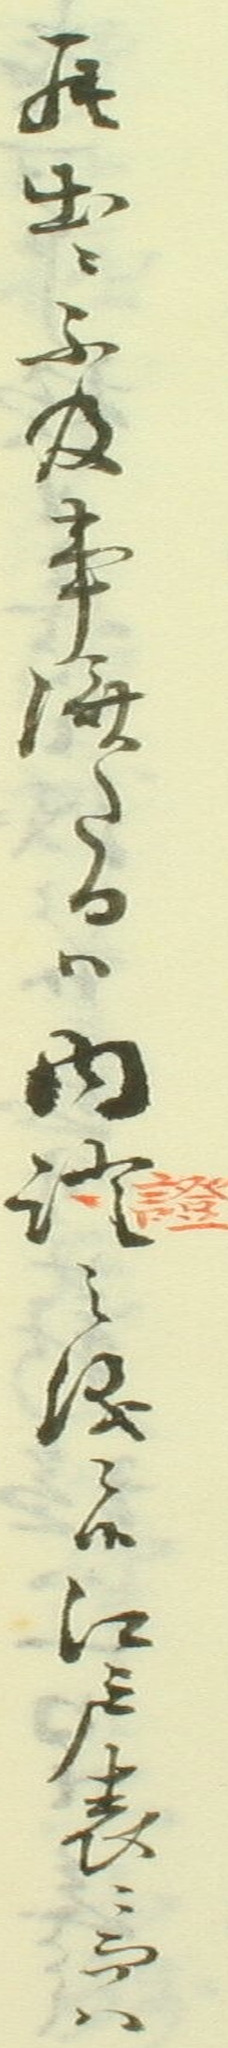罷出に不及事済たるは内証之儀に候江戸表に而は
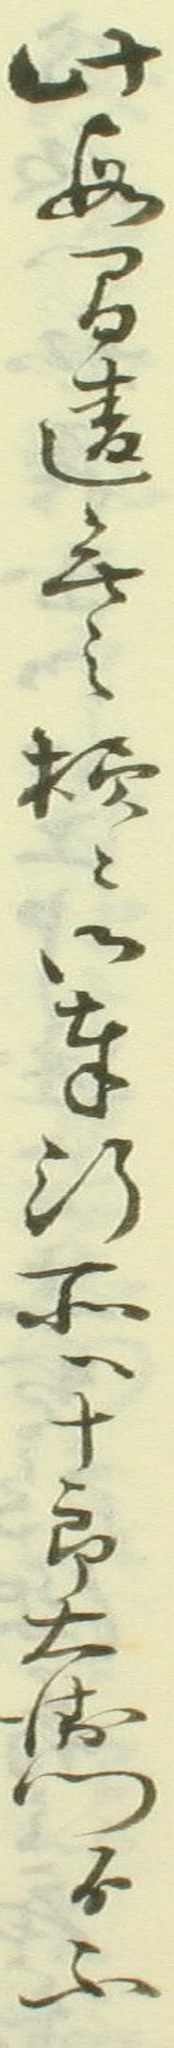此段間違無之様に御奉行所へ十郎右衛門ゟ不
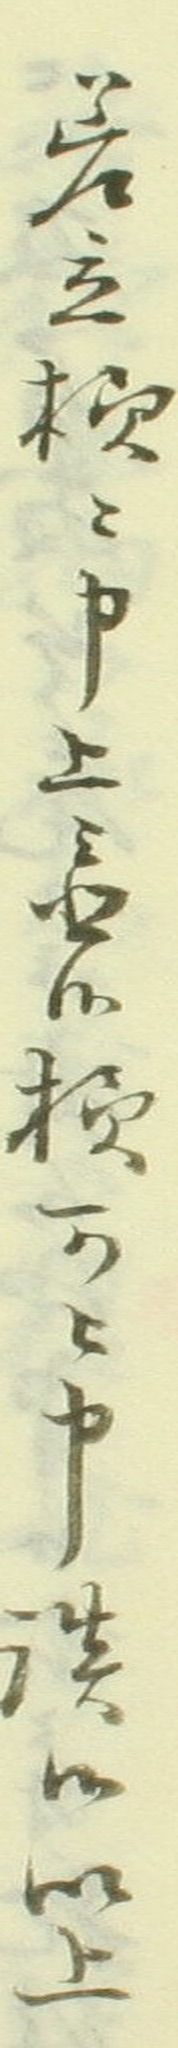差立様に申上置候様可被申談候以上
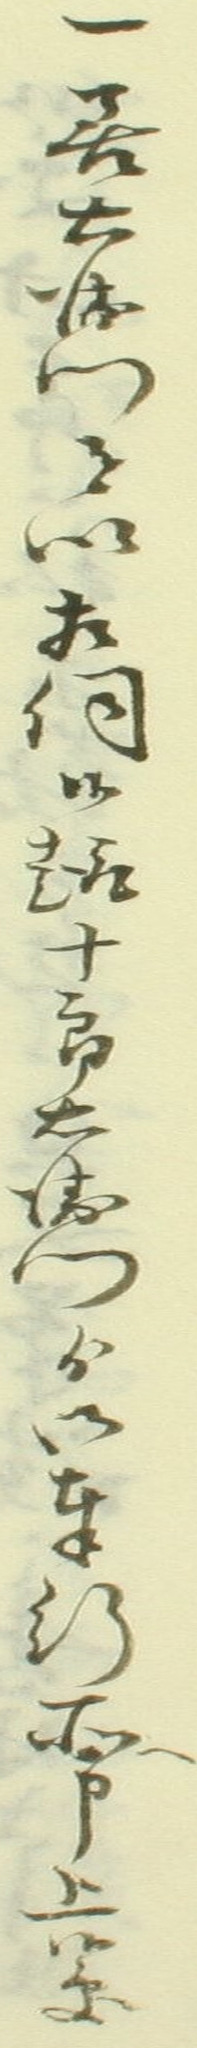一善右衛門を以相伺候趣十郎右衛門ゟ御奉行所へ申上候処
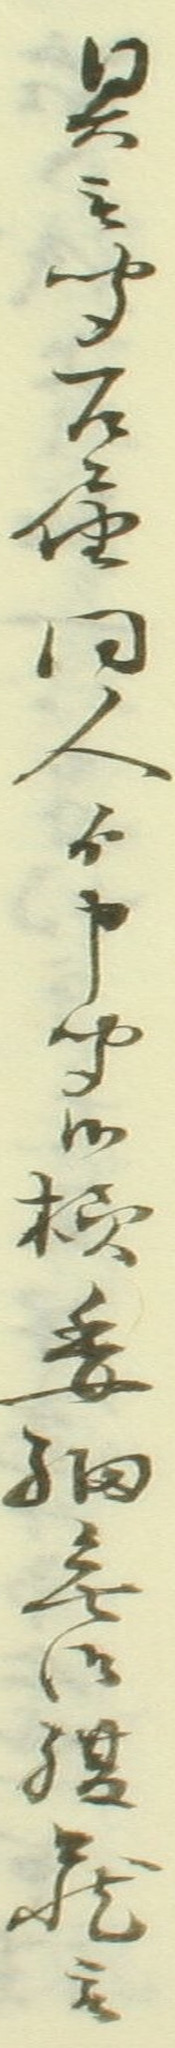具被聞召届同人ゟ申聞候様委細無御腹蔵被
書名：異国船漂着記
